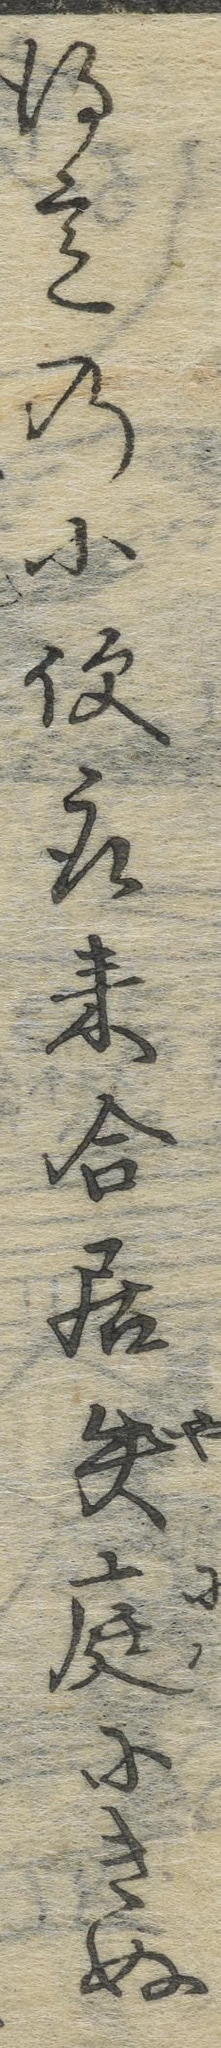得意の小使取来合居矢庭にきぬ
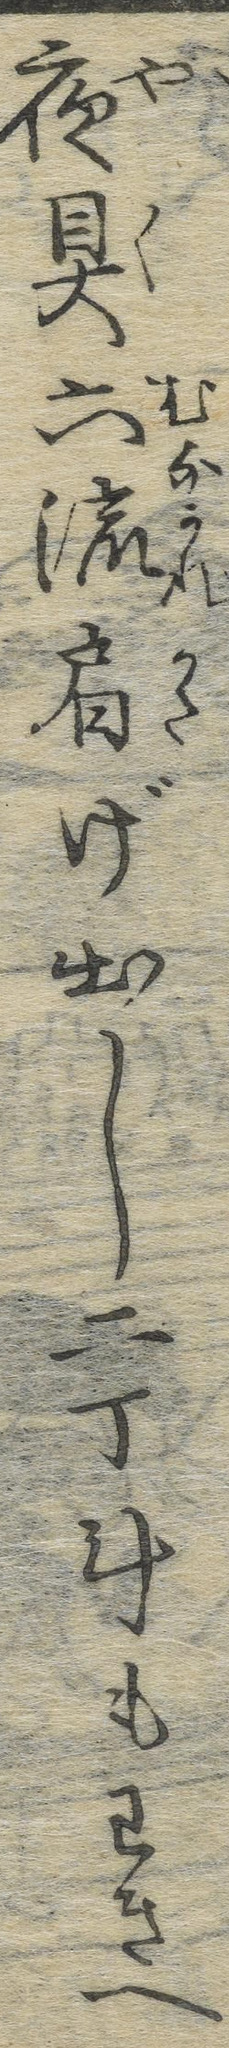夜具六流肩げ出し二丁斗もわきへ
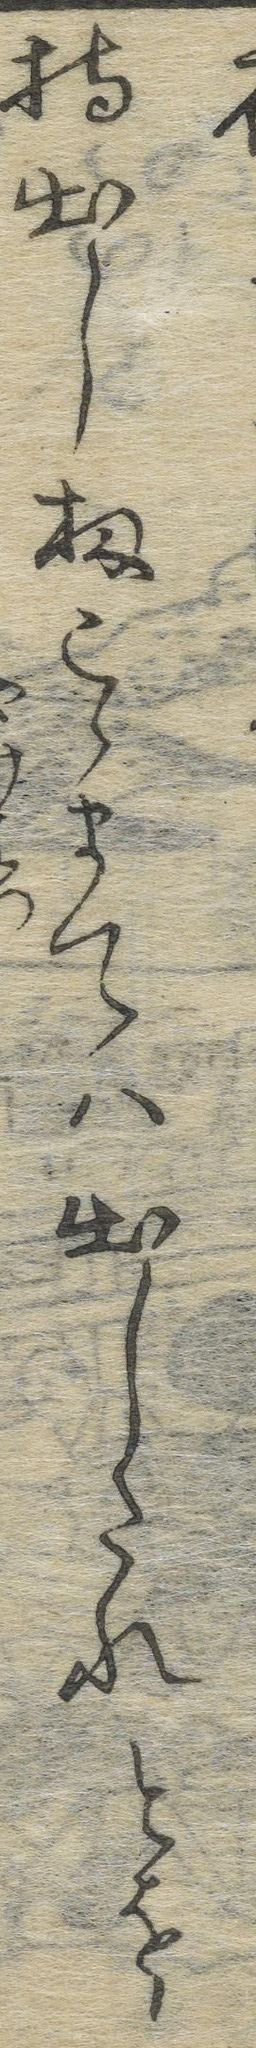持出し扨こゝまでは出したれとも
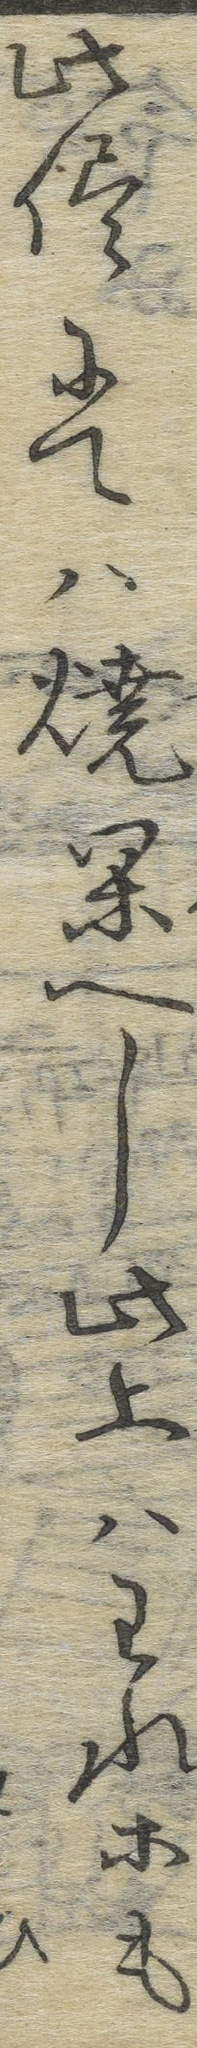此侭にては焼果へし此上はわれにも
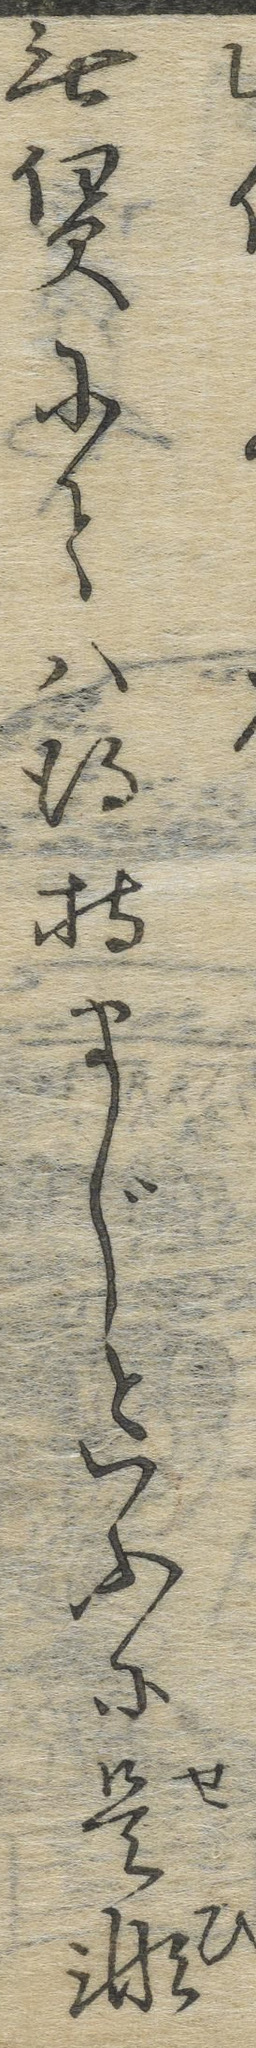無賃にては得持まじといふに是非
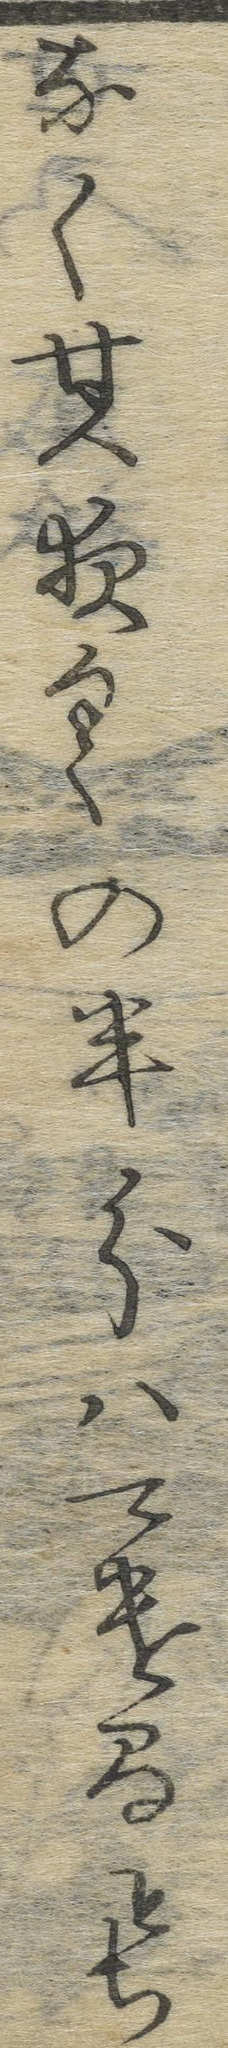なく其夜具の半分は可遣間もち
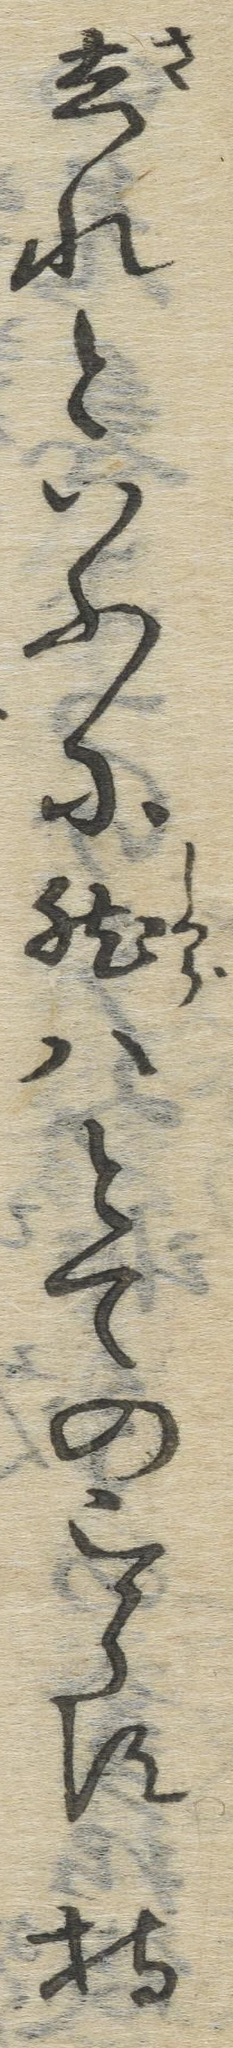去れといふに然はとてのこらす持
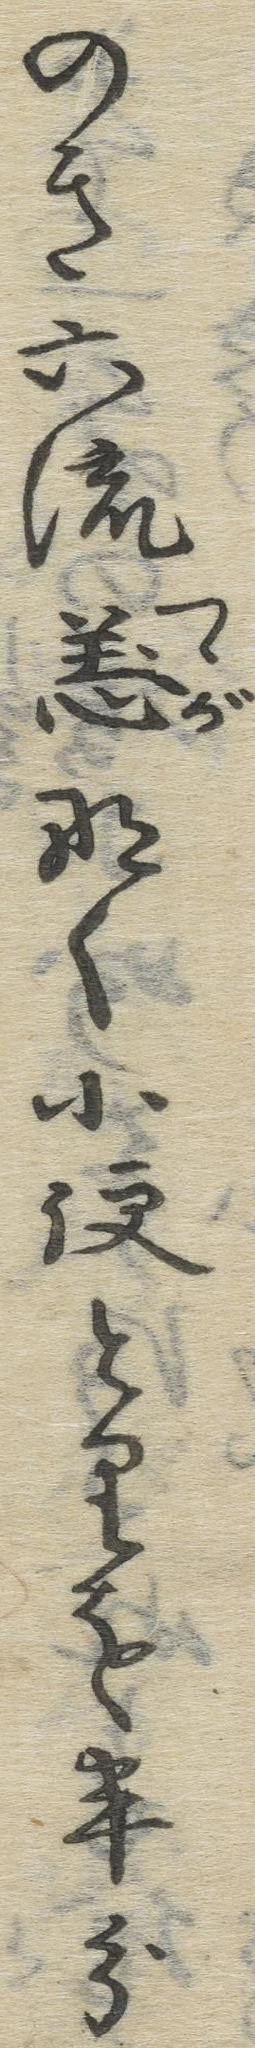のき六流恙なく小使とりも半分
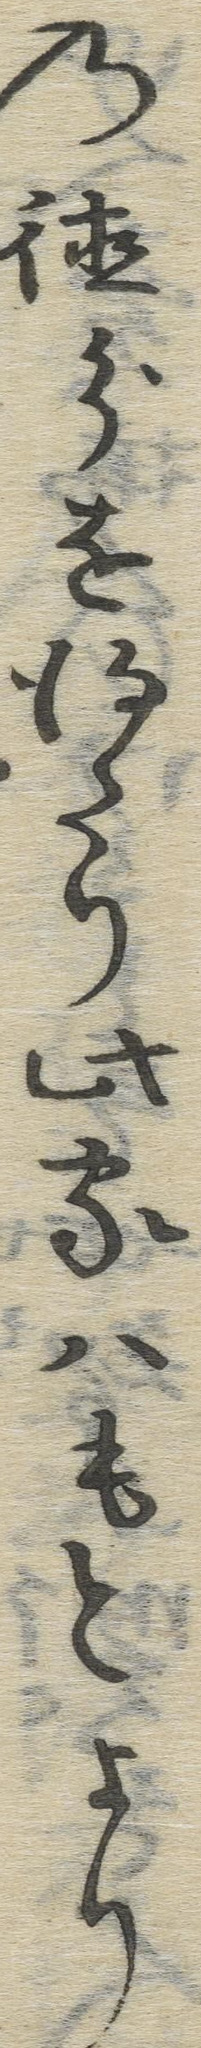の徳分を得たり此家はもとより
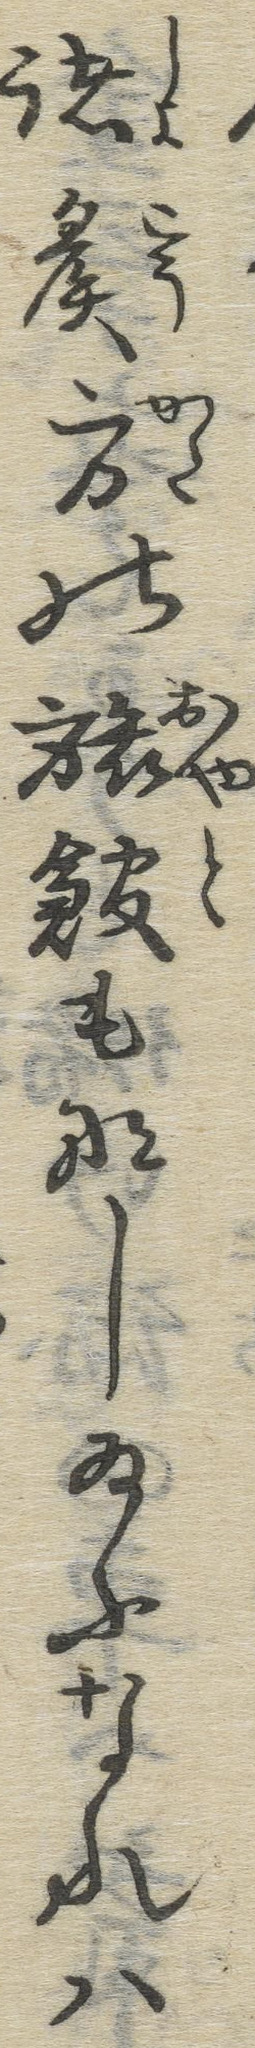諸侯方の旅館もなし給ふなれは
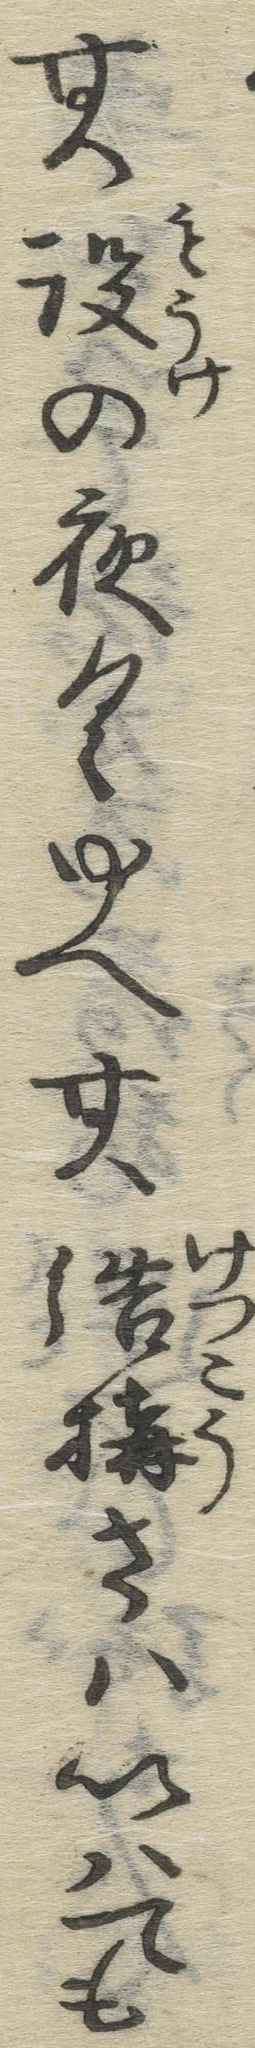其設の夜具ゆへ其結構さはいはても
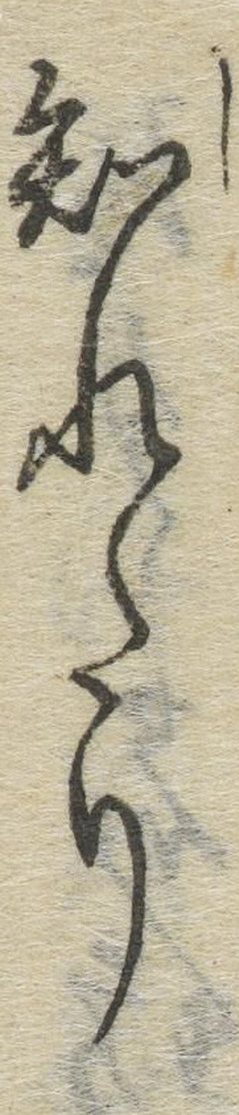知れたり
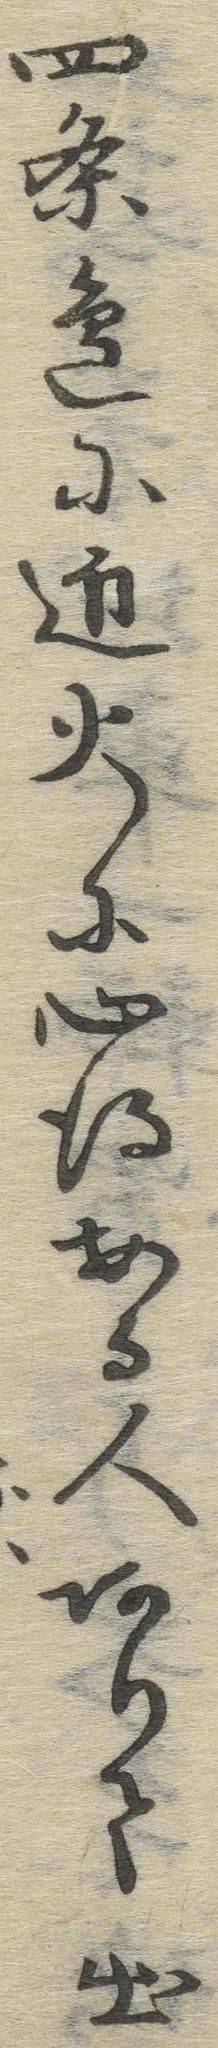四条辺に迎火に心得ある人ありて出
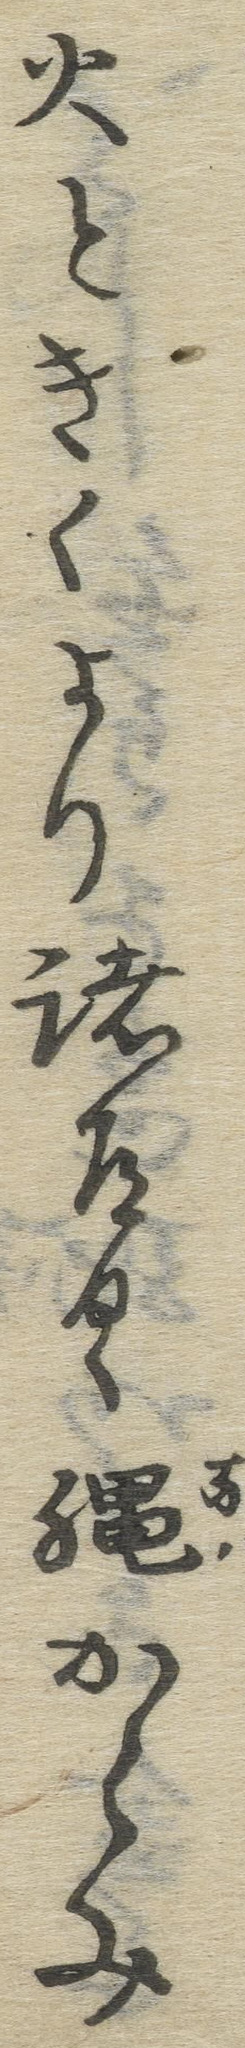火ときくより諸道具縄からみ

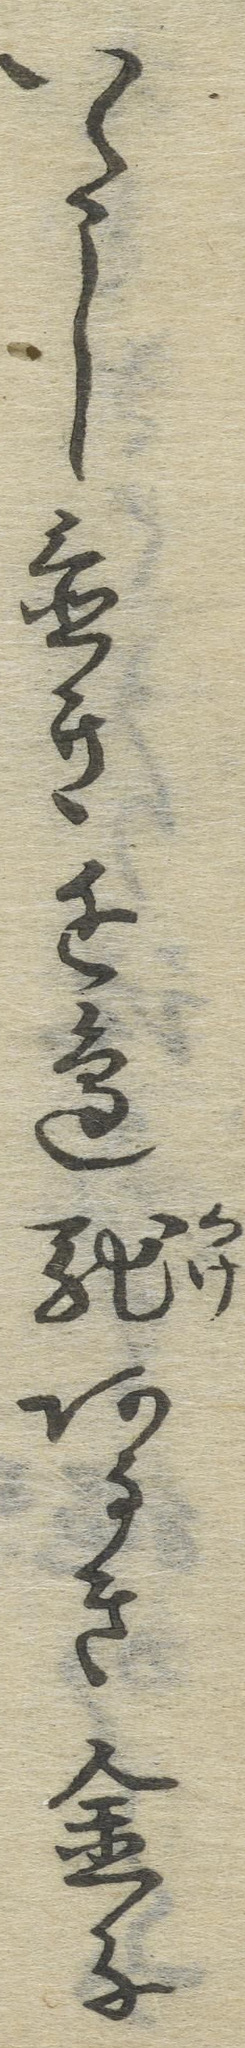いたし置き近邊懸あるき金子
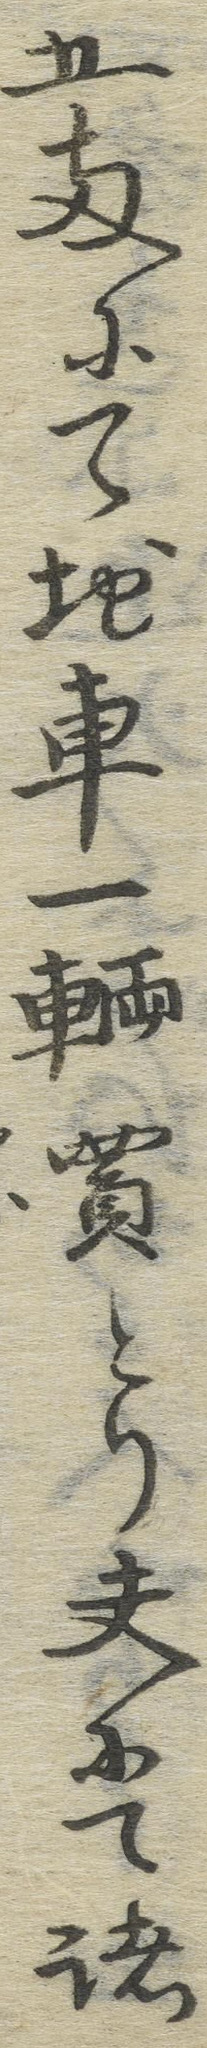五両にて地車一輛買とり夫にて諸
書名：あきの日照
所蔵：東京大学地震研究所図書室 Earthquake Research Institute Library, The University of Tokyo, JAPAN
